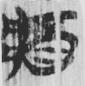𨟻（將）
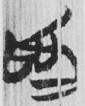爲
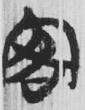客
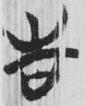告
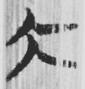大（太）
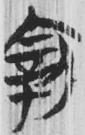○（宰）
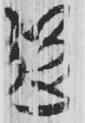○（辸）
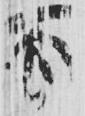而
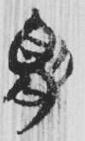{胃刀}（謂）
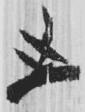之
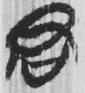君
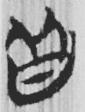皆
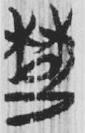楚
